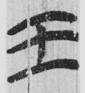王
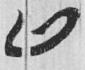㠯（以）
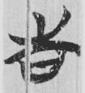告
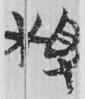○（相）
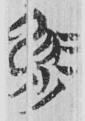○（徙）
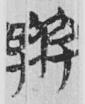與
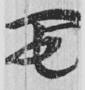𠁩
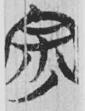余（舍）
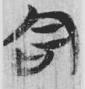含（今）
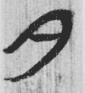夕
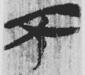不
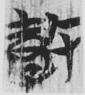穀
